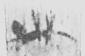卅
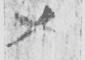五
